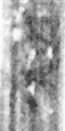車
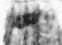一
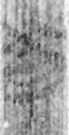𨌤
